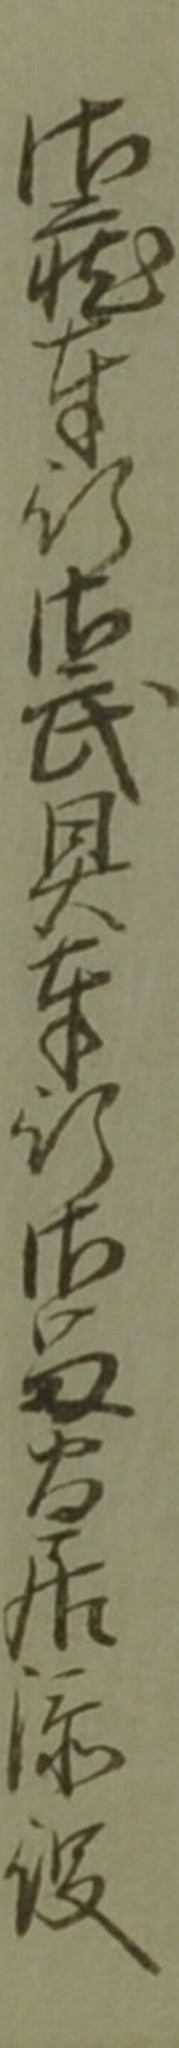御蔵奉行御武具奉行御留守居添役
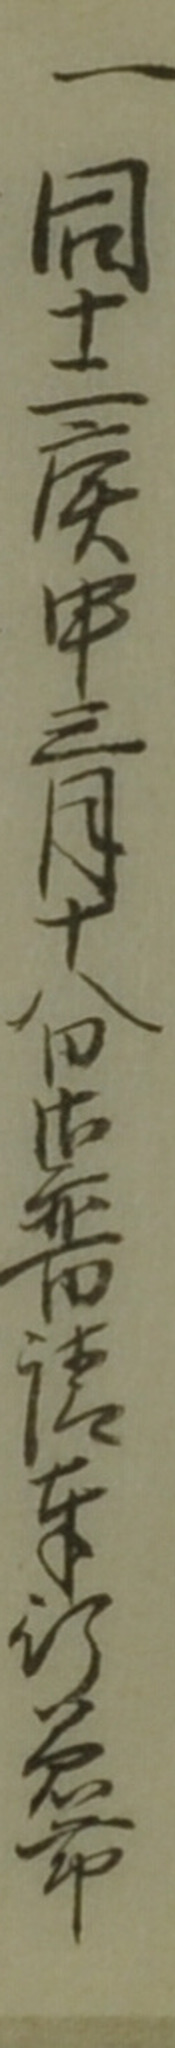一同十二庚申三月十八日御普請奉行兼帯
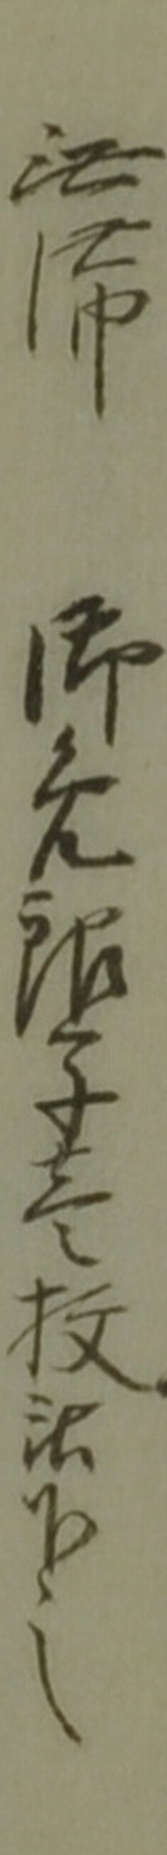無滞御免銀子壱枚被下之
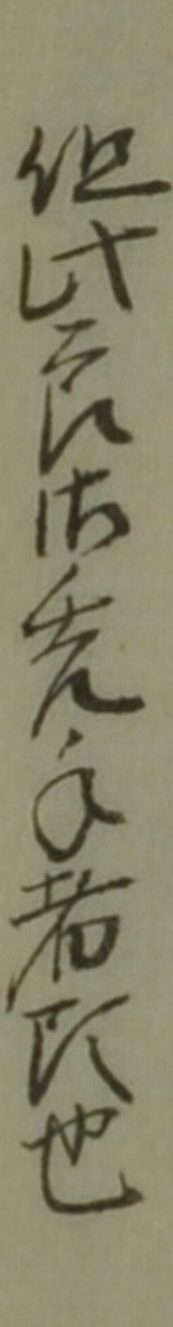但此節御先手者頭也
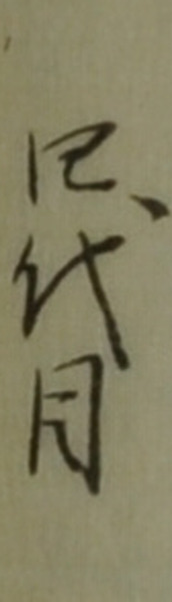四代目
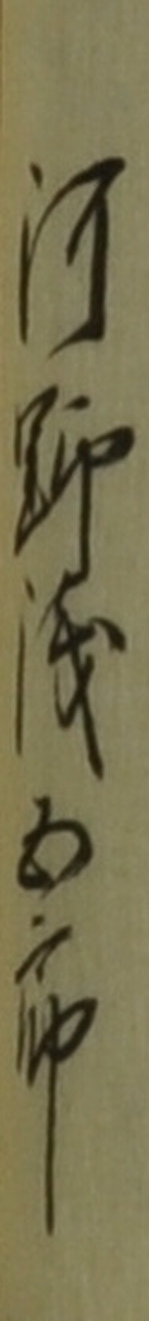河野儀五郎
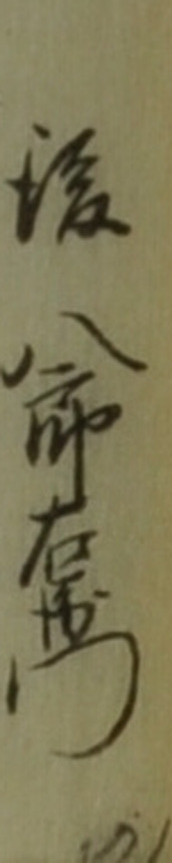後八郎右衛門
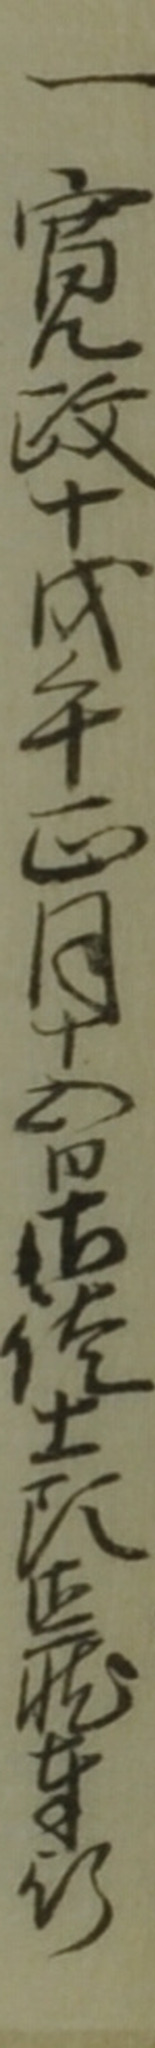一寛政十戊午正月十五日御徒士頭御蔵奉行
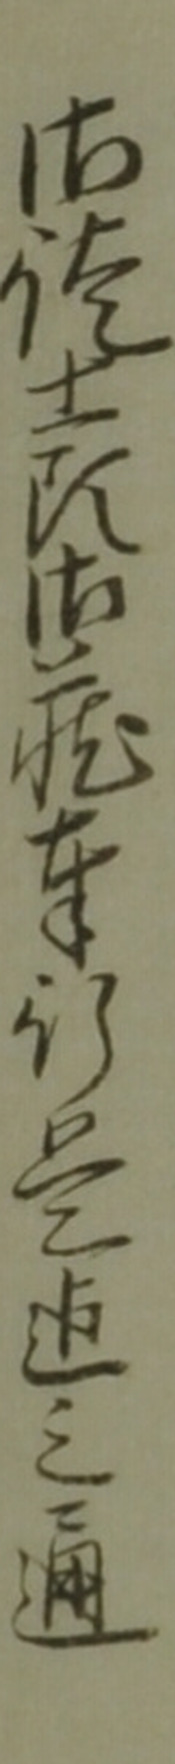御徒士頭御蔵奉行是迄之通
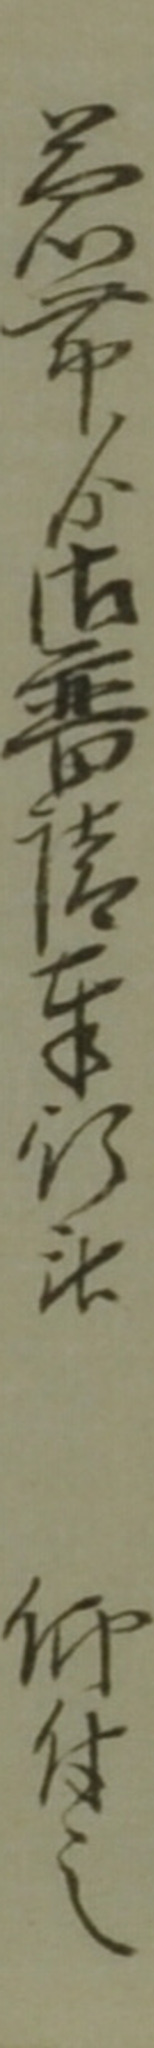兼帯ゟ御普請奉行被仰付之
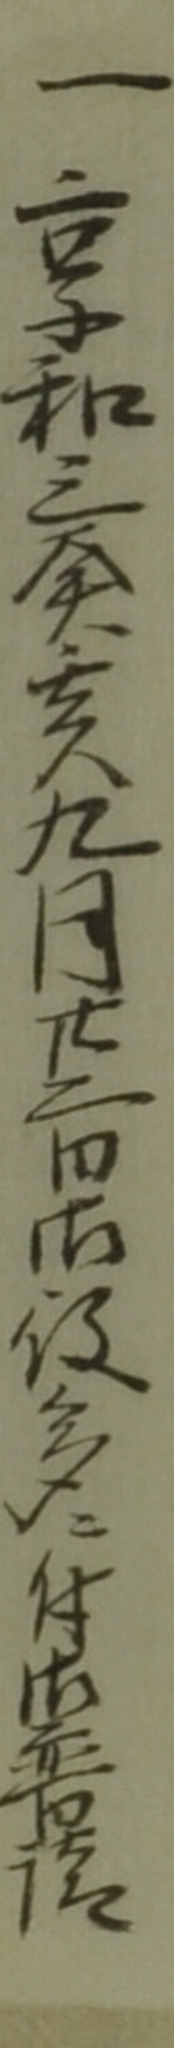一享和三癸亥九月廿二日御役多ニ付御普請
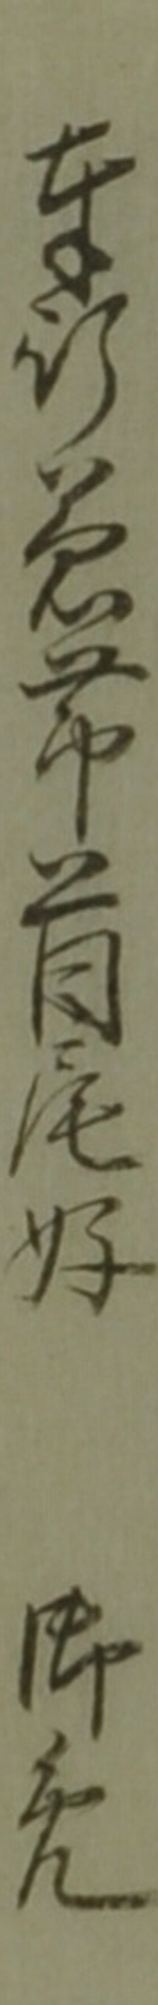奉行兼帯首尾好御免
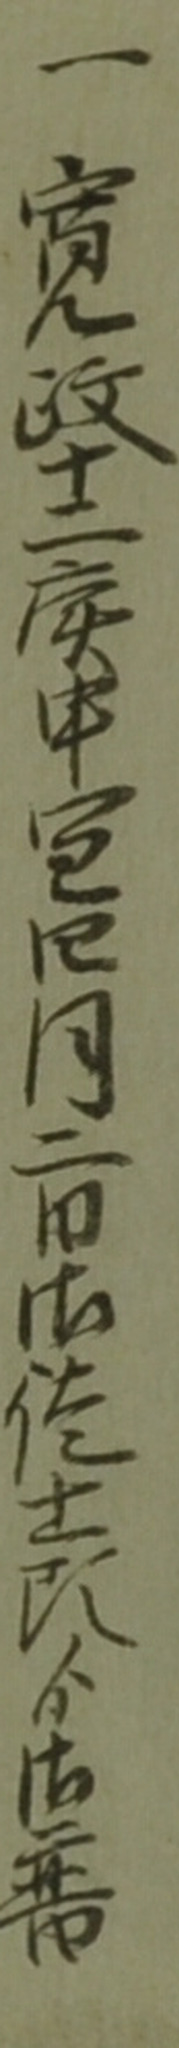一寛政十二庚申閏四月二日御徒士頭ゟ御普
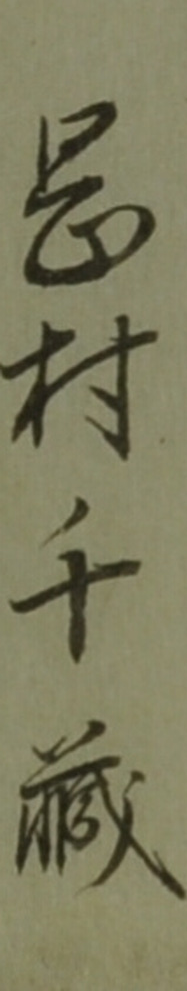岡村千蔵
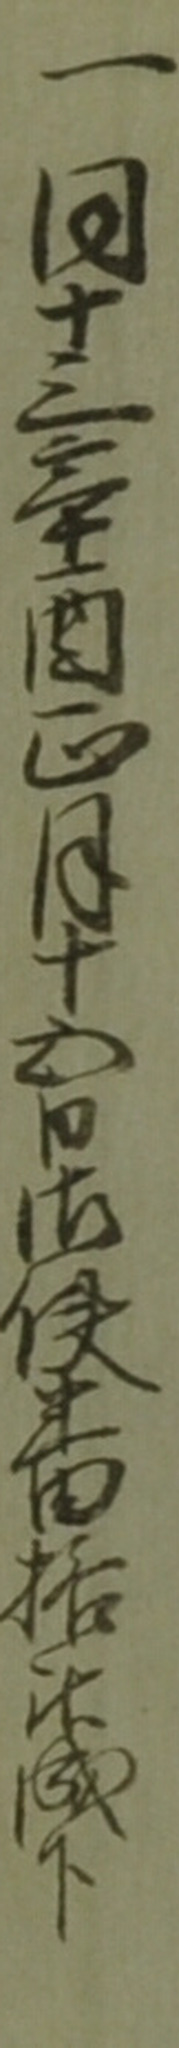一同十三辛酉正月十五日御使番格被成下
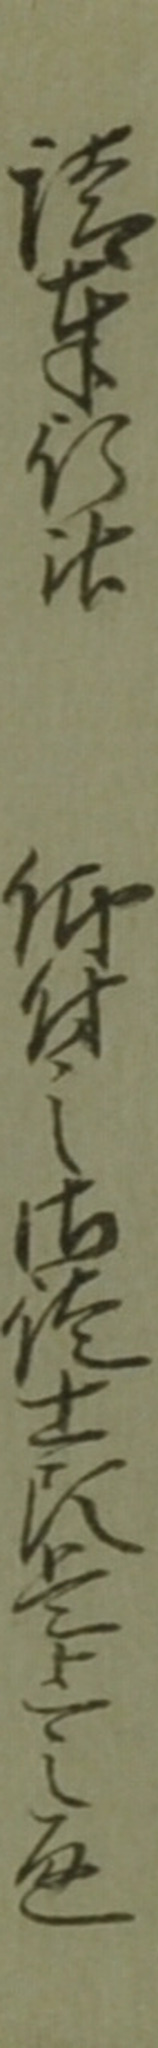請奉行被仰付之御徒士頭是迄之通
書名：諸御役代々録（六）
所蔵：伊那市立高遠町図書館・合同会社AMANE
